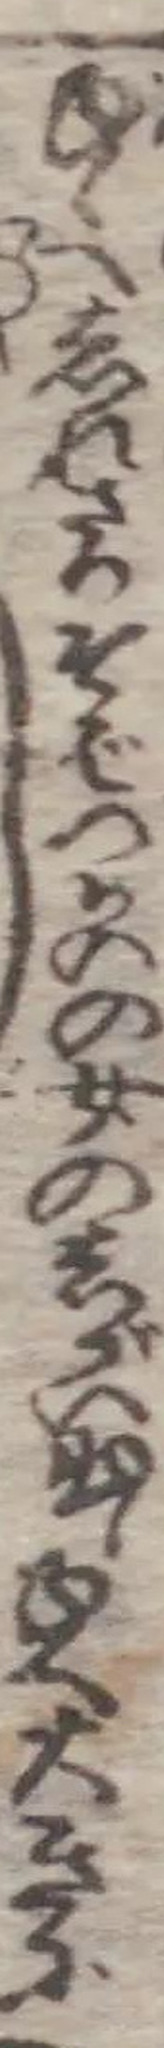ゆくへしれさるそばつかいの女のしがい出しゆへ大きに
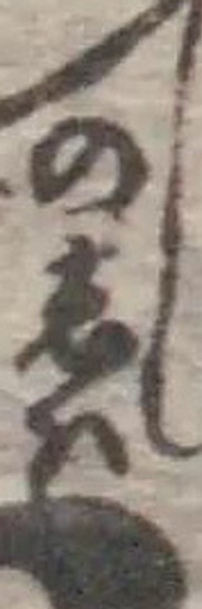のしは
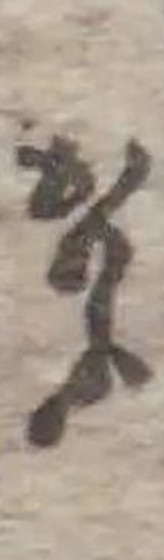おもふ

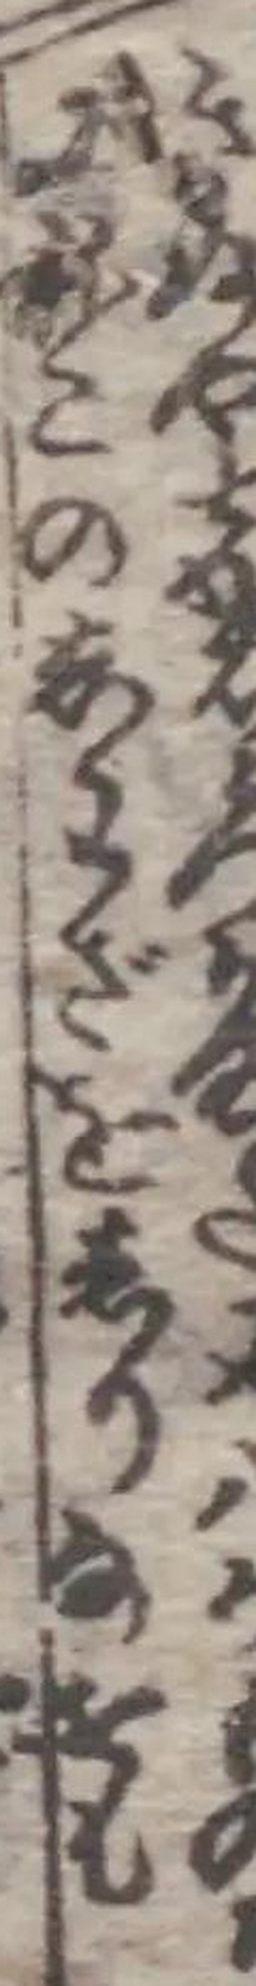にねこのしわざをしりなをも
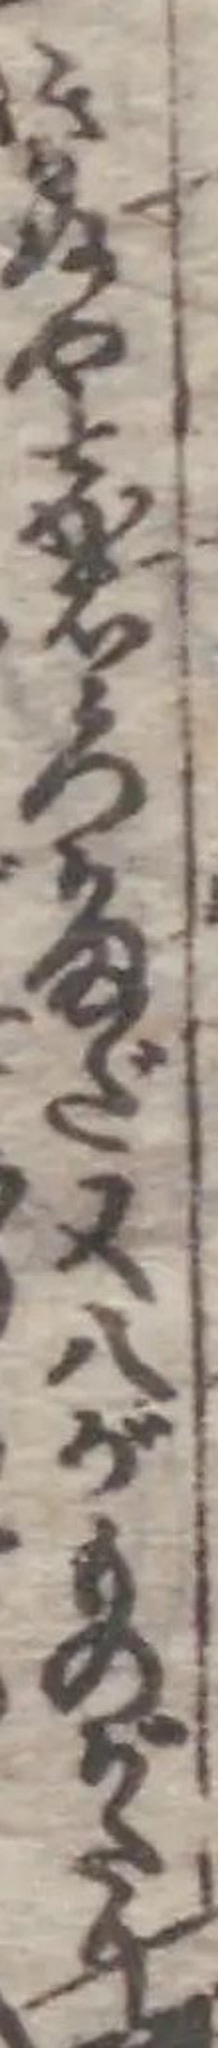きぬや嘉右衛門かまだ又八がものがたり
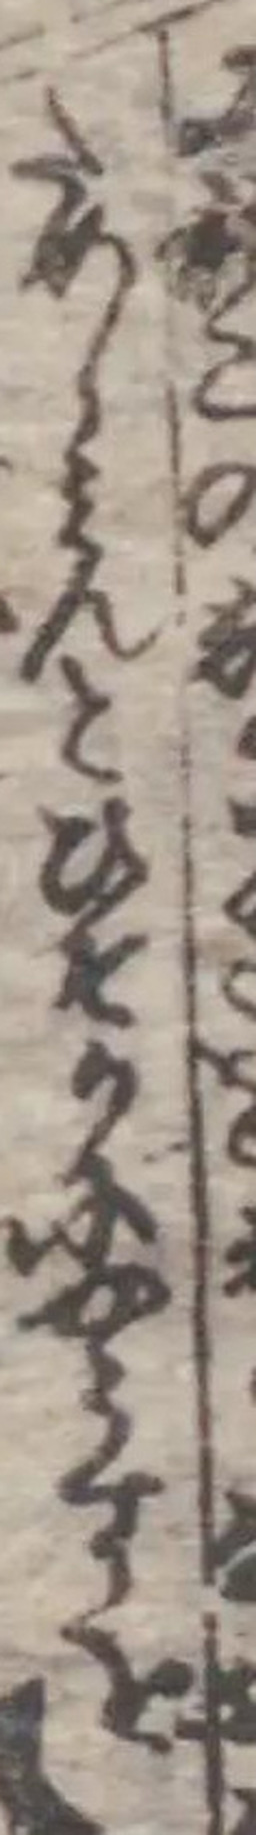ためしみんとひそかにやうすを
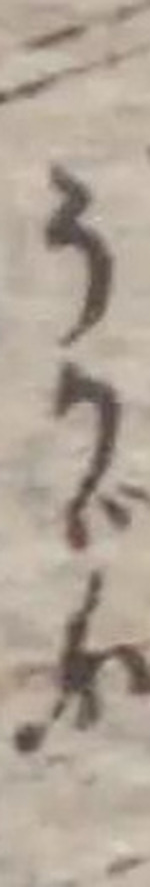うかゞふ
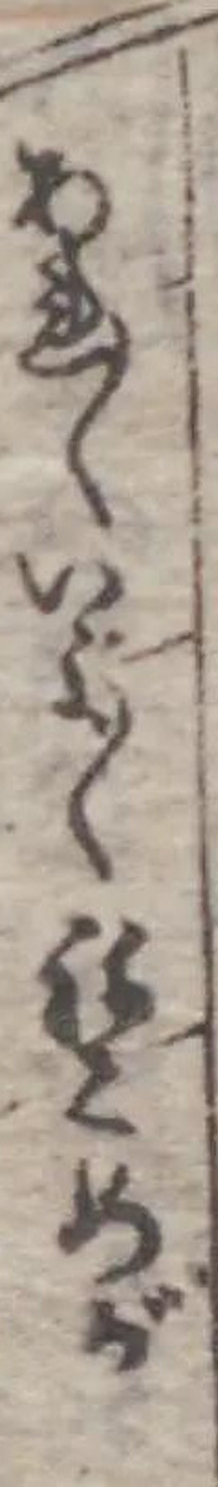あれ〳〵いよ〳〵ねこめが
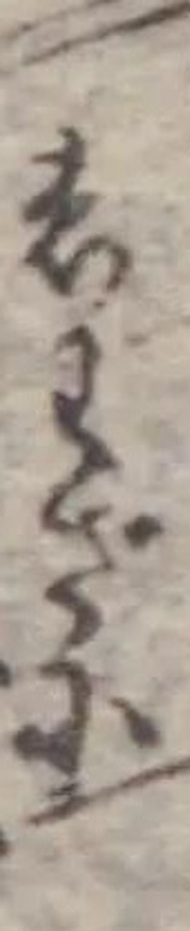しわざに
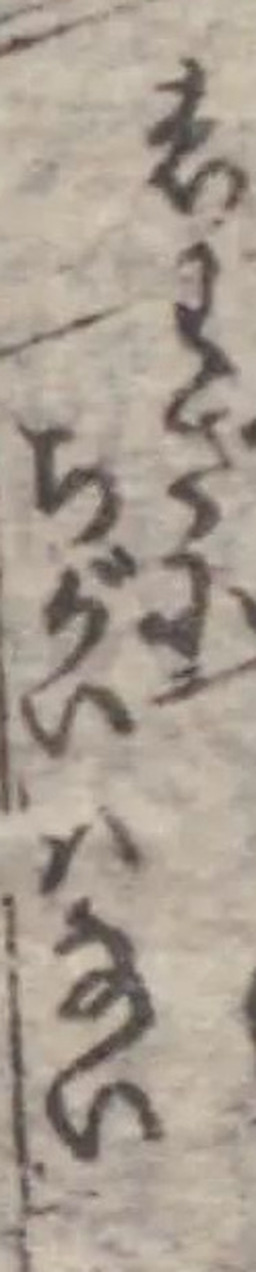ちがいはない
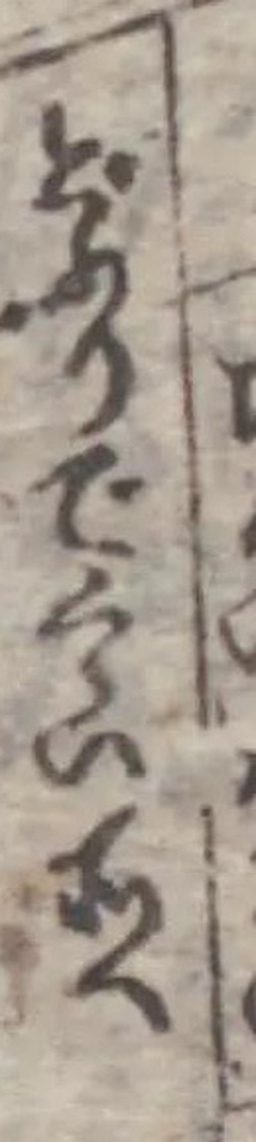どふりでくらい所へ
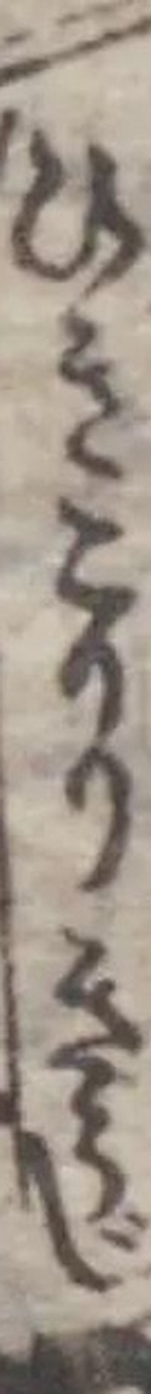ひきこもりきうじ
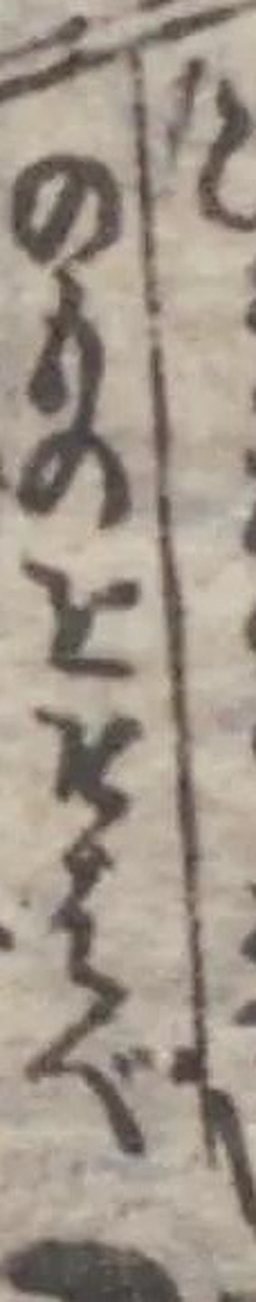のものをそばへ
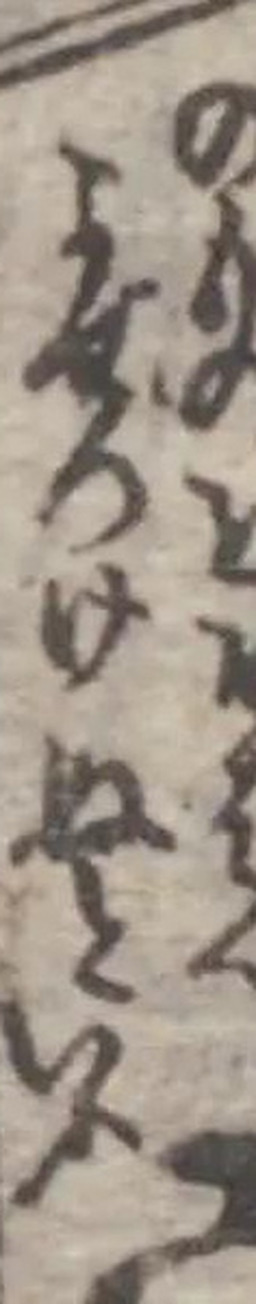よせつけぬといふ
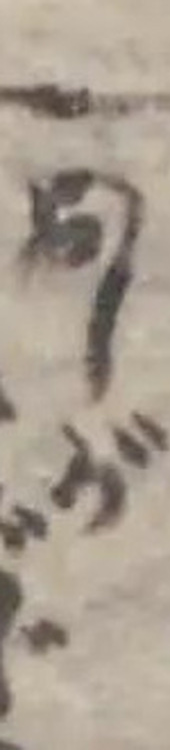おしが
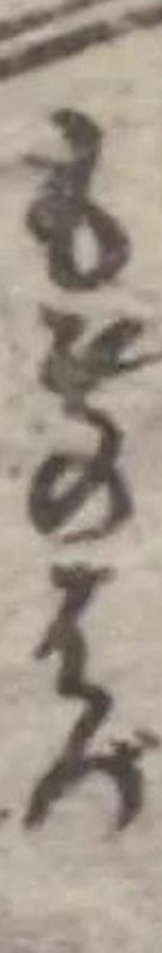もそのはづ
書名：鎌田又八 2巻
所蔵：国立国会図書館 National Diet Library, JAPAN
